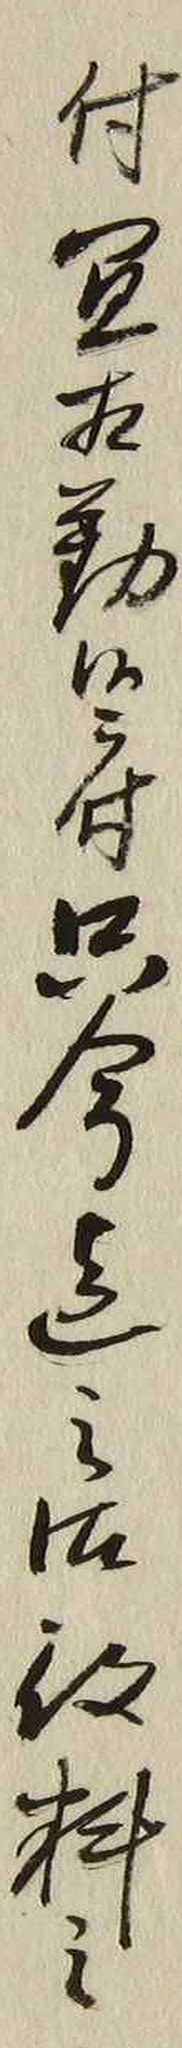付宜相勤候ニ付只今迄之御役料之
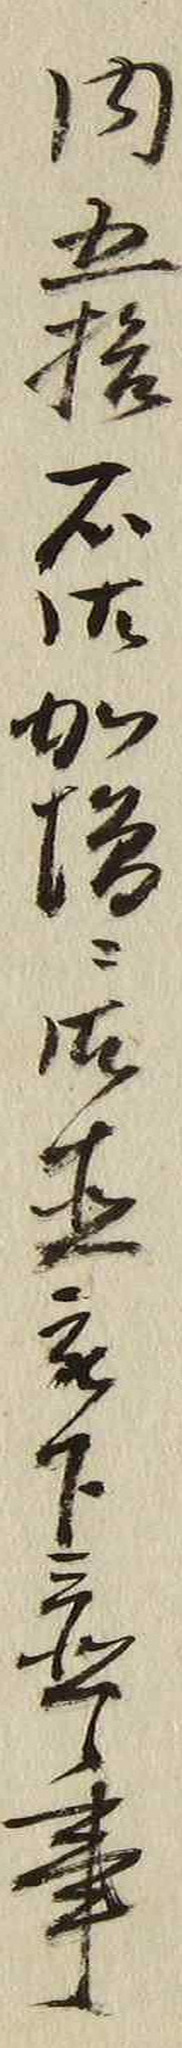内五拾石御加僧ニ御直被下置候事
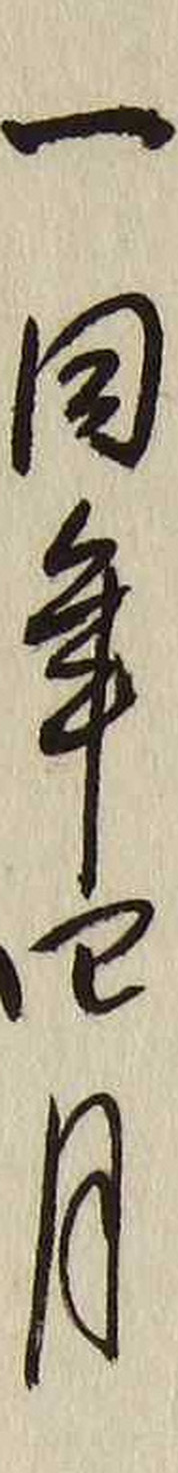一同年四月
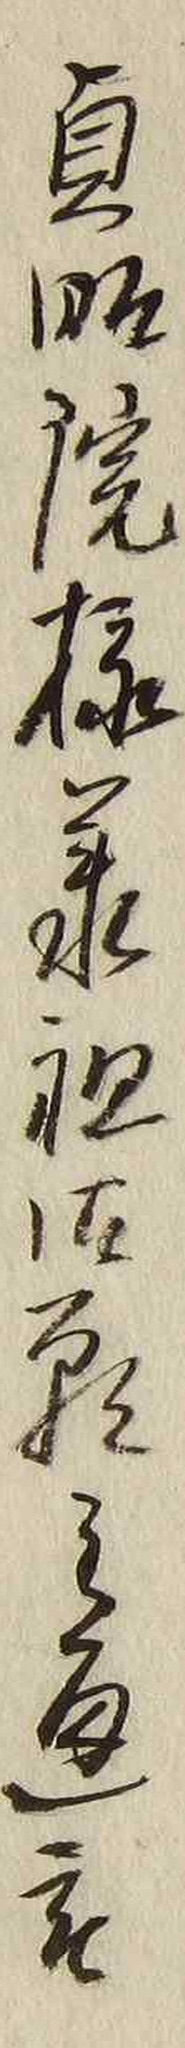貞昭院様承祖御願之通被
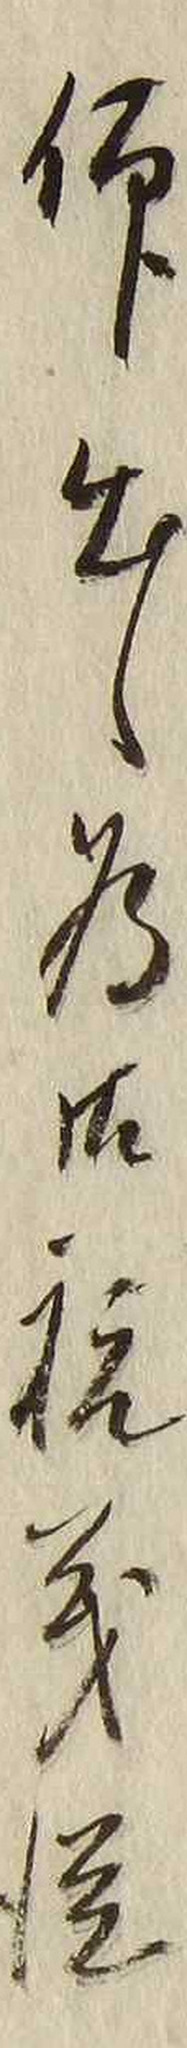仰出候為御祝義従

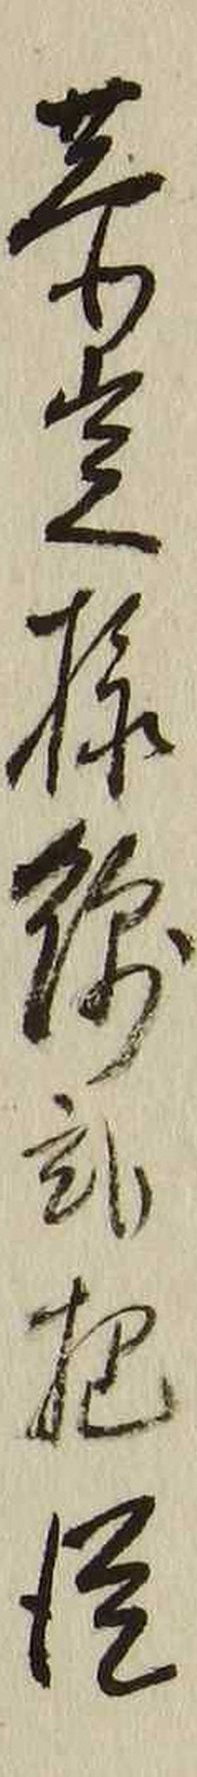恭定様綿弐把従
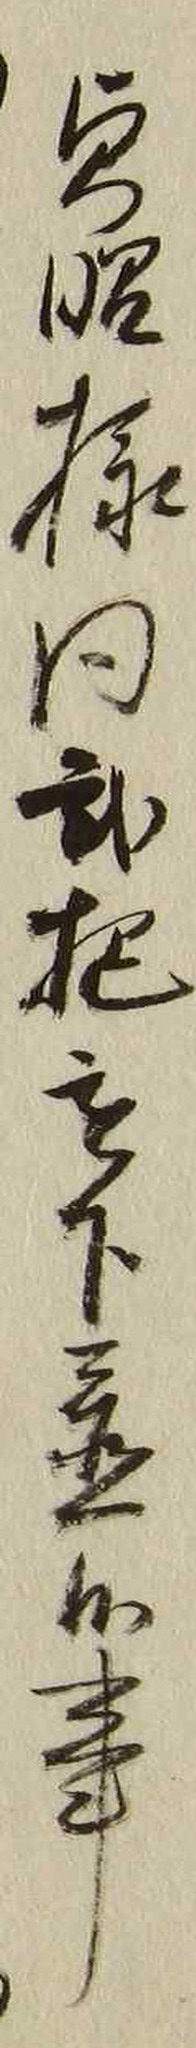貞昭様同弐把被下置候事
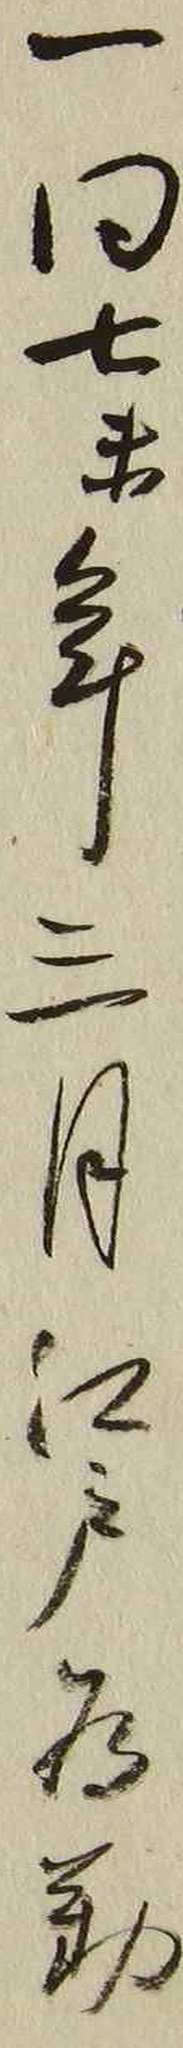一同七未年三月江戸為勤
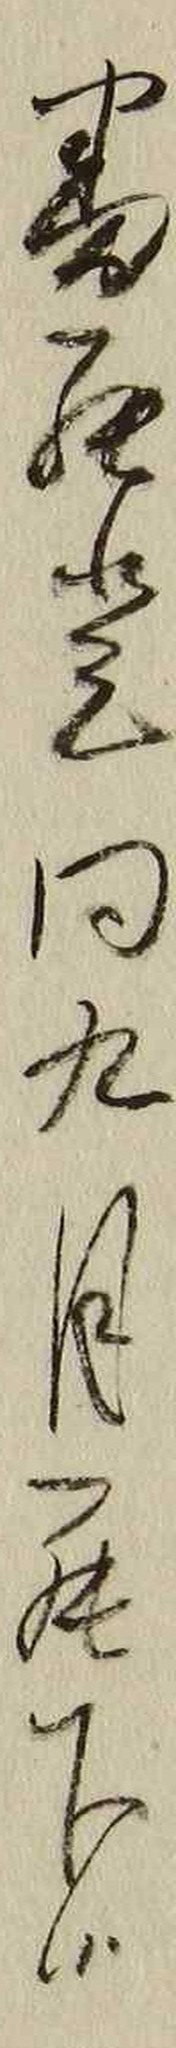番罷登同九月罷下候
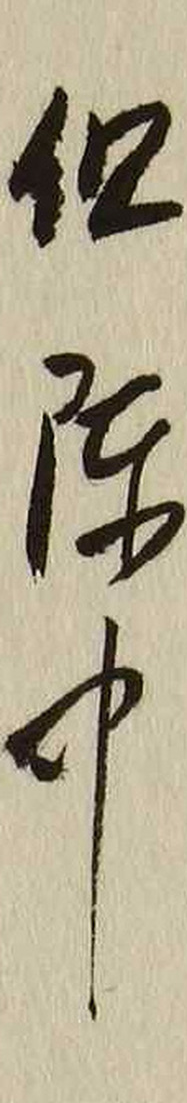但陣中
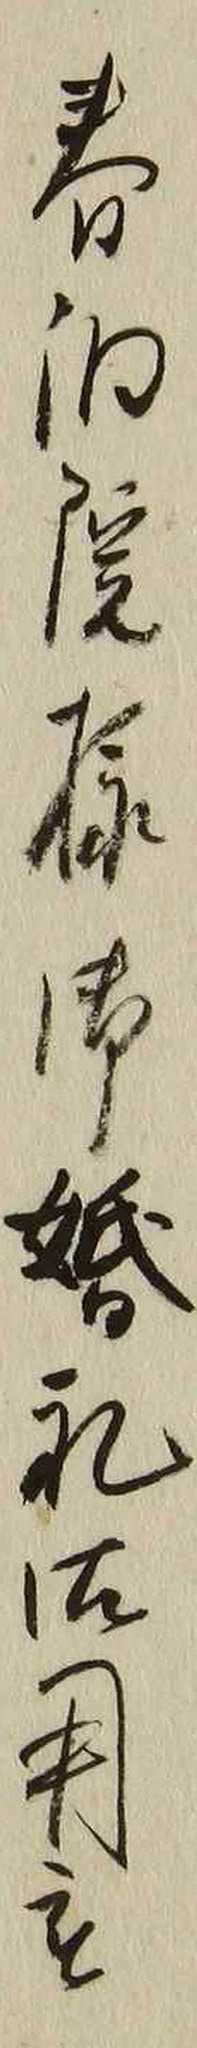春洞院様御婚礼御用被
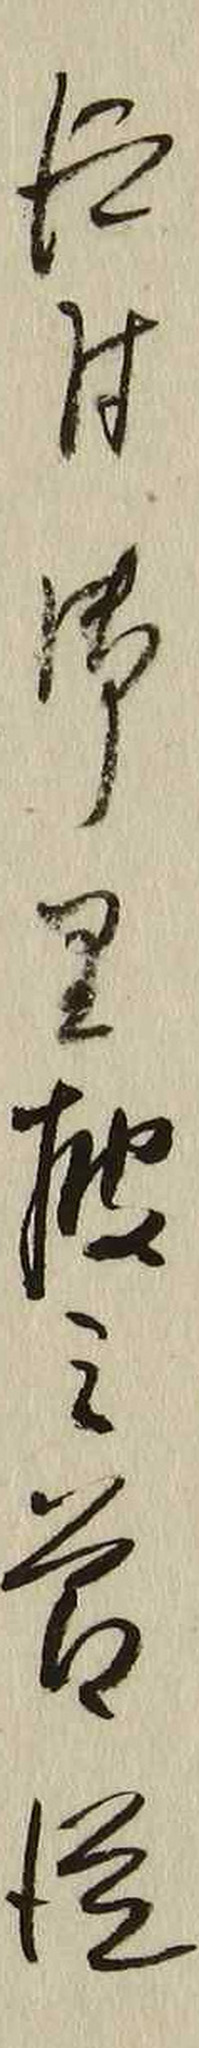仰付御里披之節従
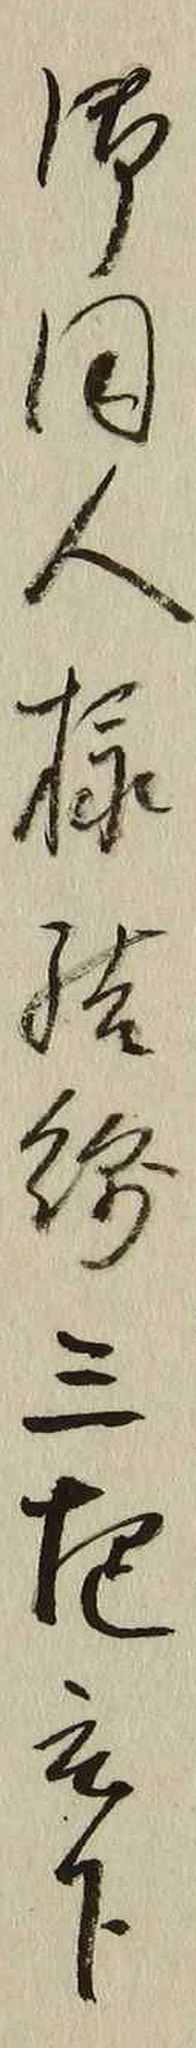御同人様結綿三把被下
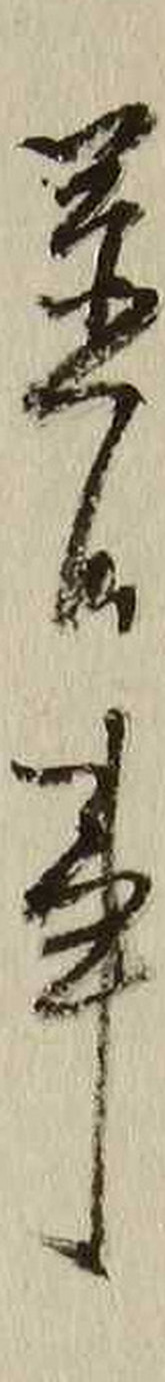置候事
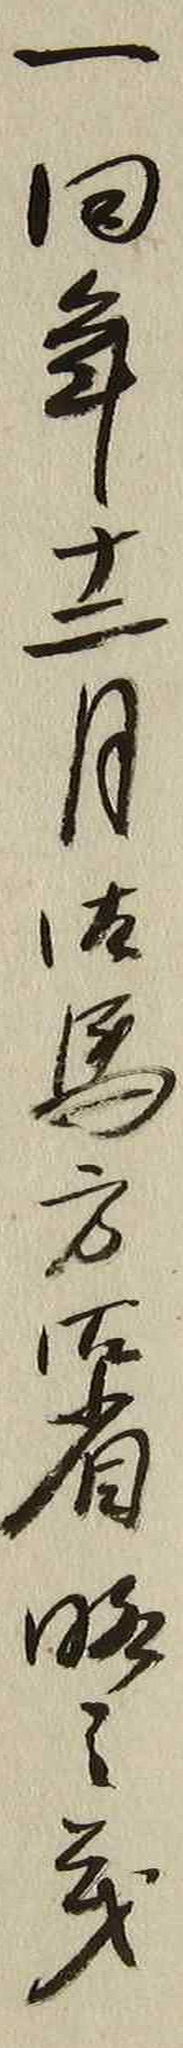一同年十二月御馬方御省略之義
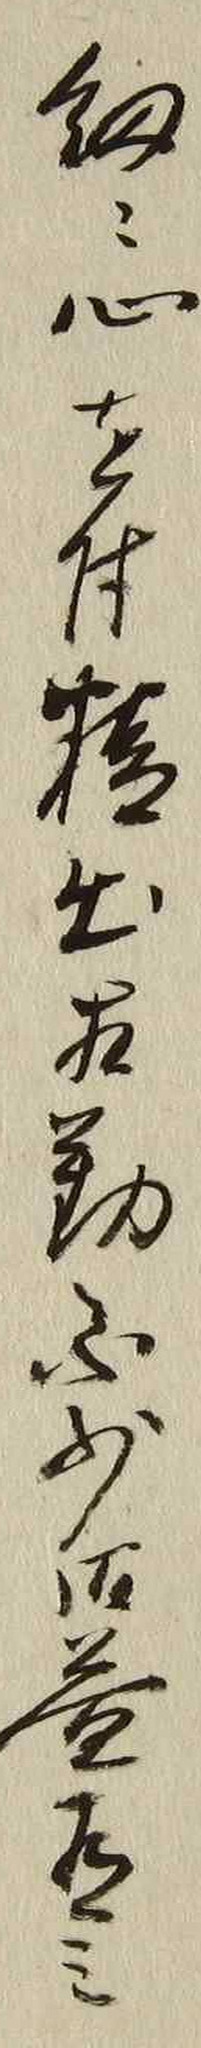細々心を付精出相勤不少御益有之
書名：諸士系譜　巻之356　す之部6
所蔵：会津若松市立会津図書館
